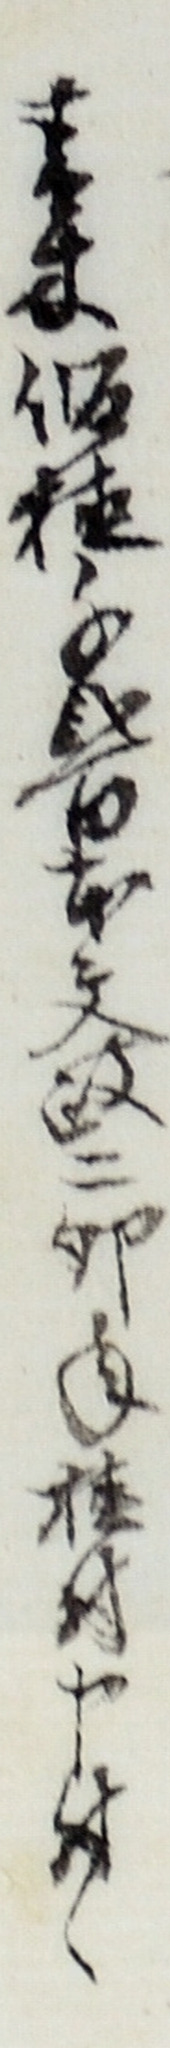青木仮植千弐百本文政二卯年植付申付候
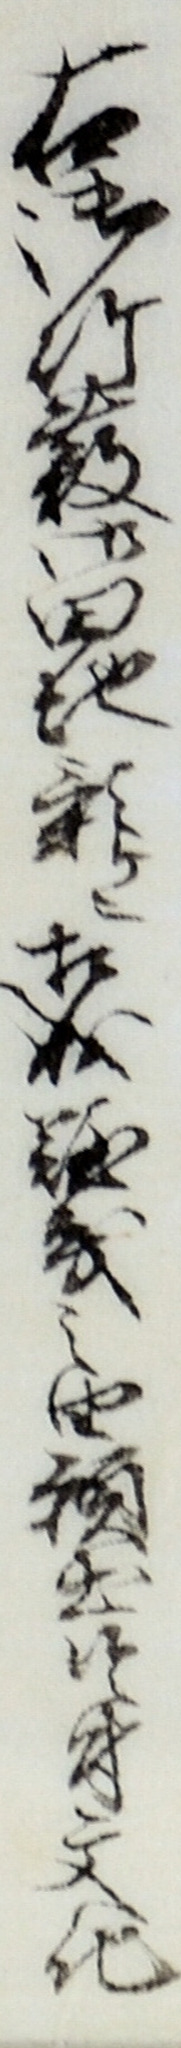右御竹藪御田地影ケニ相成難義之由願出候ニ付文化
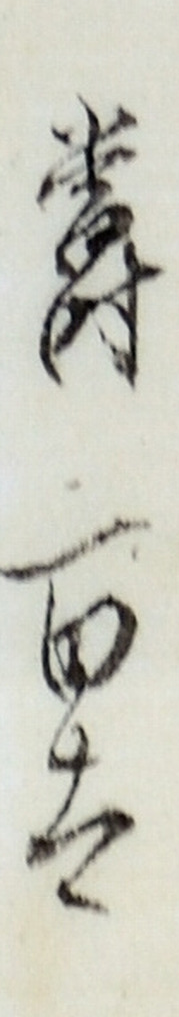当時百吉
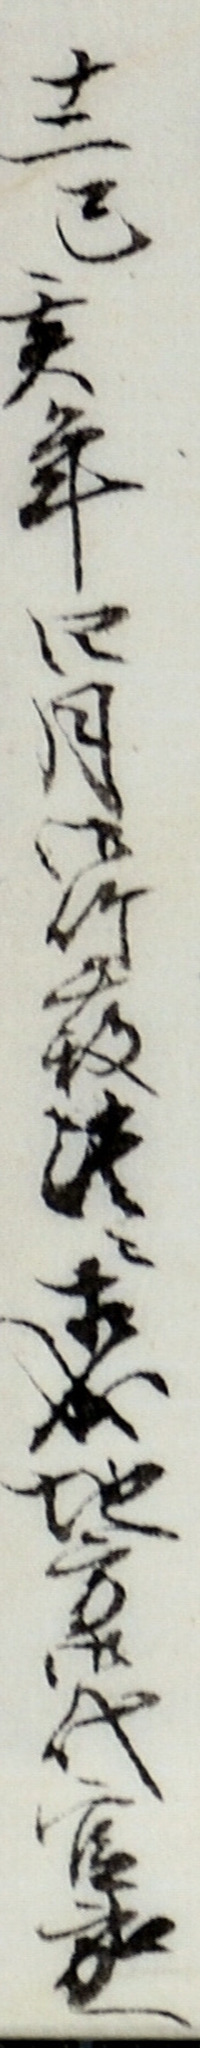十二己亥年四月御竹藪潰ニ相成地方御代官方へ
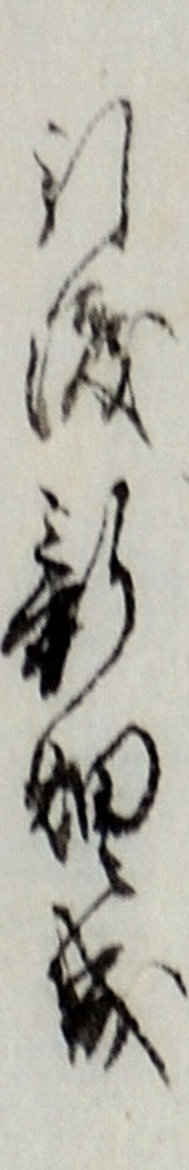引渡新畑ニ成

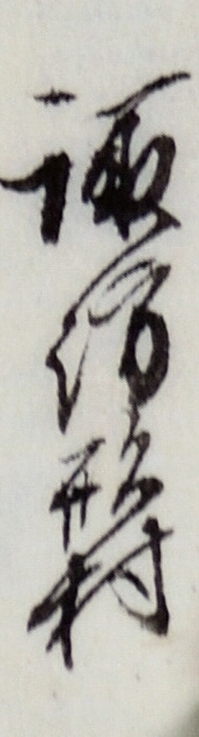諏訪形村
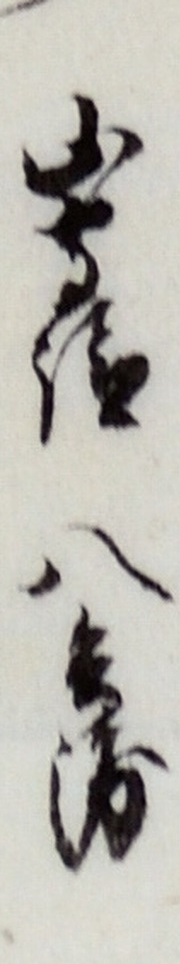山守請八兵衛
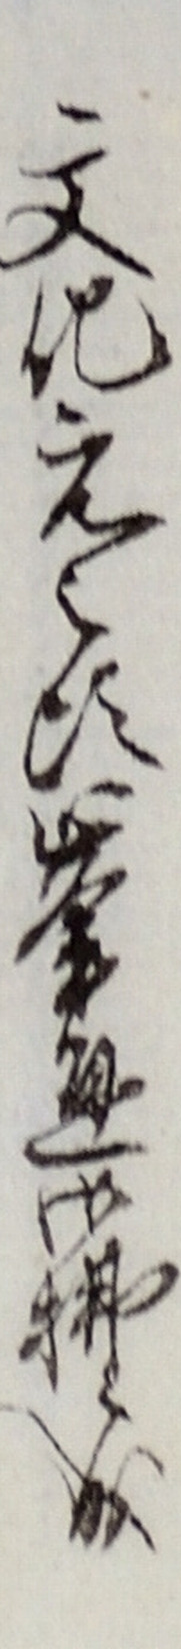文化元之頃峯通御払ニ成
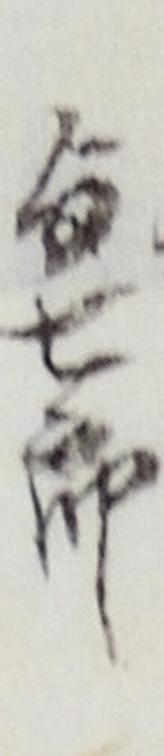与七郎
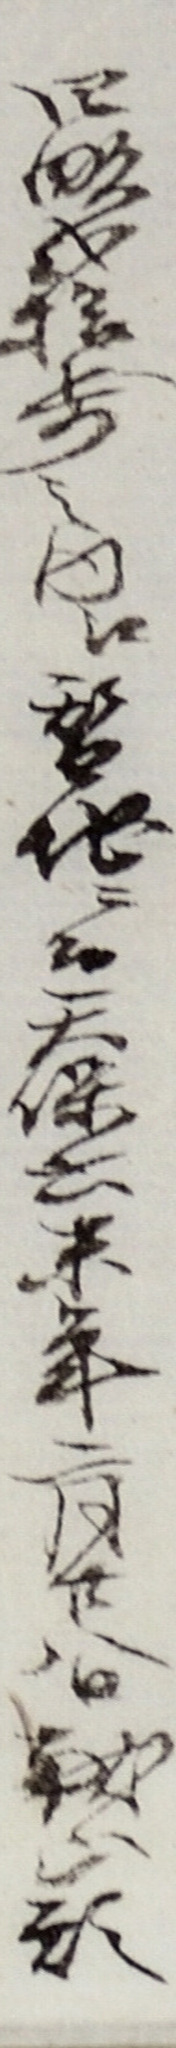四畝弐拾歩之内え替地ニ而天保六未年二月廿八日献山願
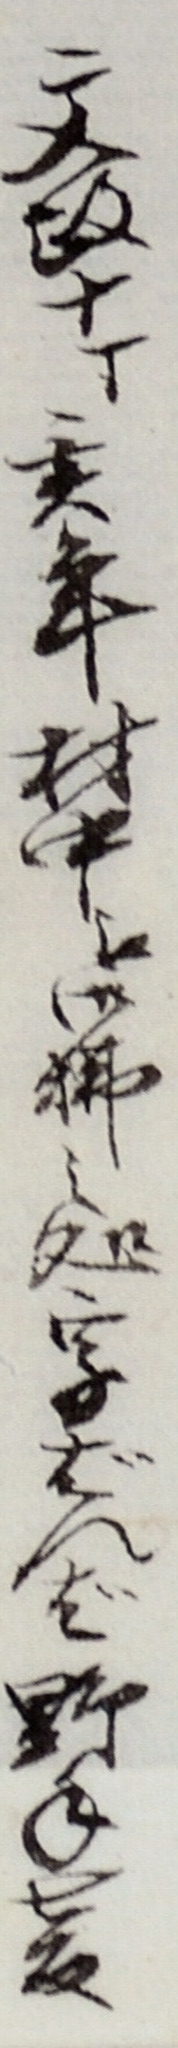文政十丁亥年村中え御払之処字ばんば野手七反
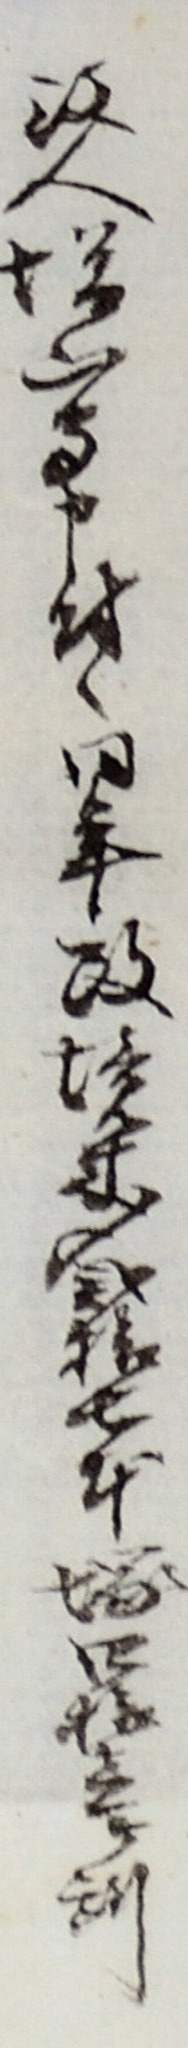役人増山守申付候同年改境木〆弐拾七本塚四拾壱ケ所
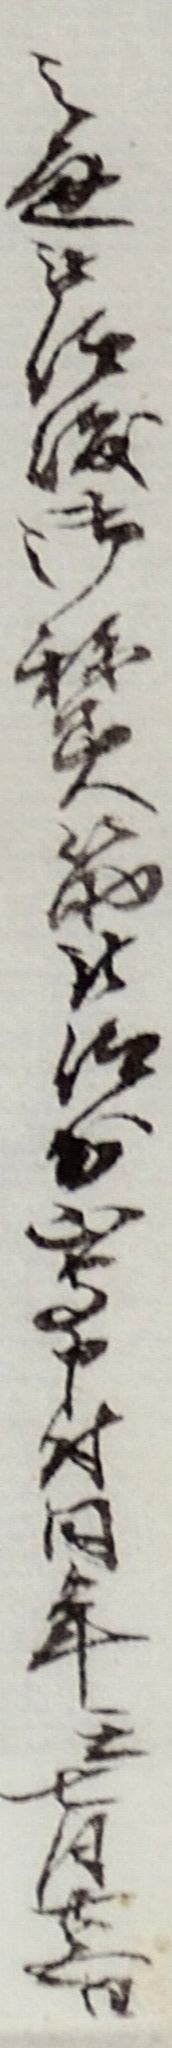之通被仰渡御称美筋被仰出山守申付同年閏七月廿五日
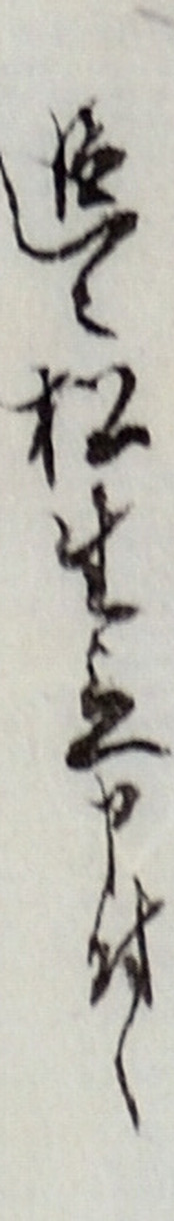追々松生立申付候
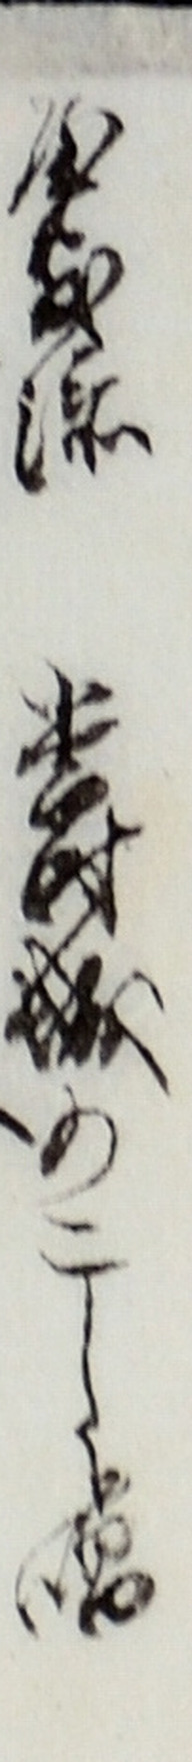屋敷添当時城のこしト唱
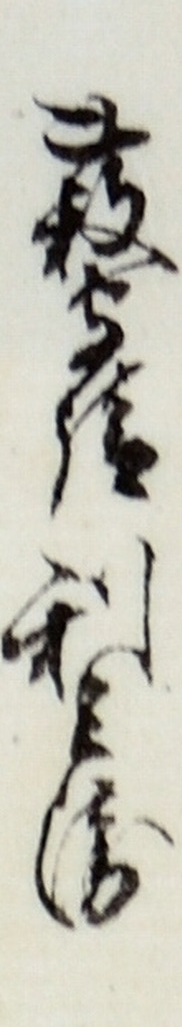藪守請利兵衛
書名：山林帳草稿
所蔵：伊那市立高遠町図書館・合同会社AMANE
